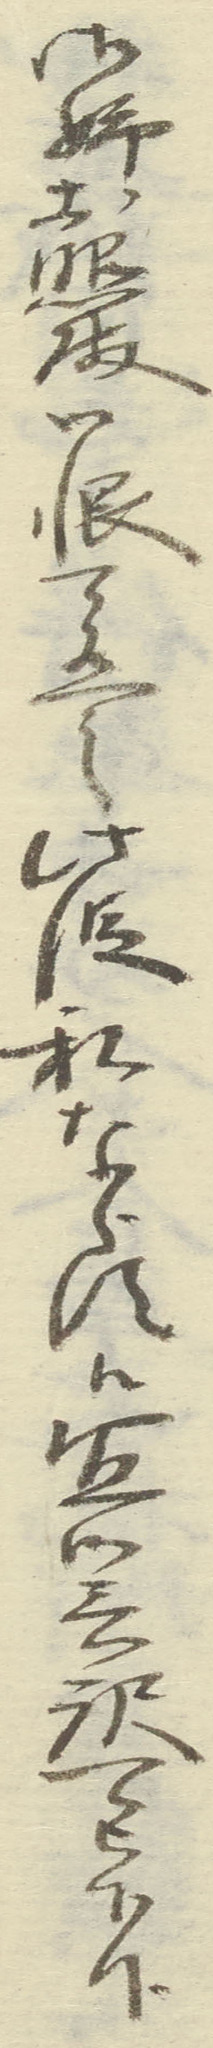御姉お照殿御恨可有之此段私ならす候宜御言訳可被下候
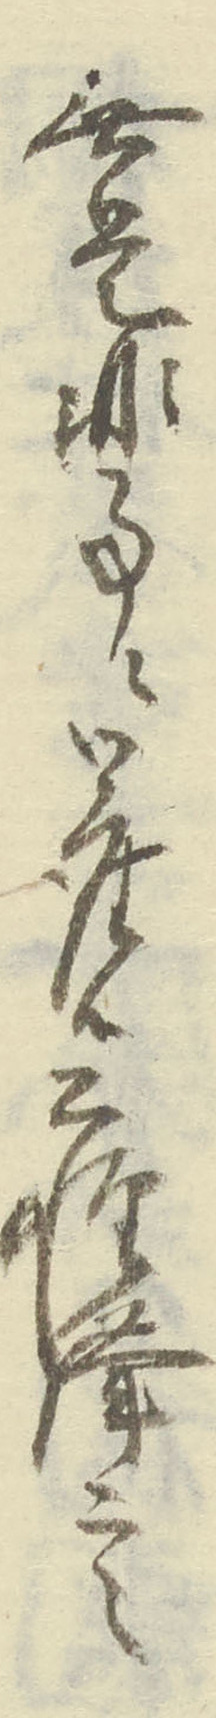無是非事ニ御座候恐惶謹言
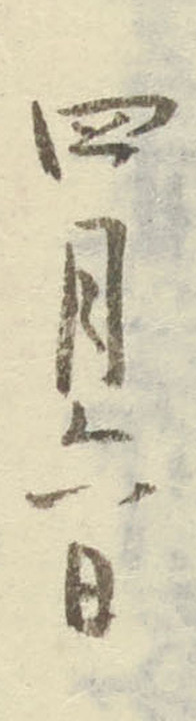四月六日
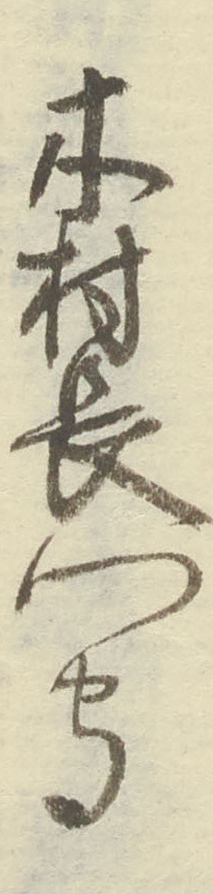木村長門守
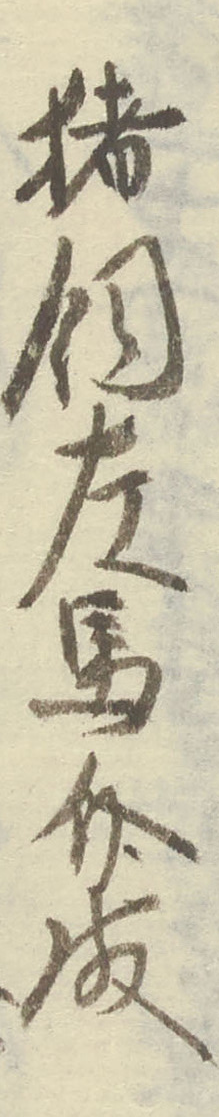猪飼左馬介殿
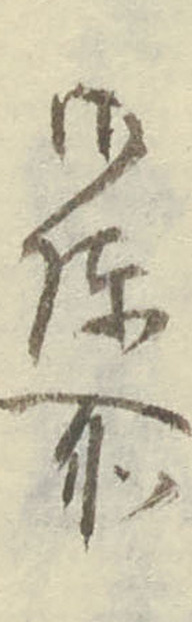御陣所
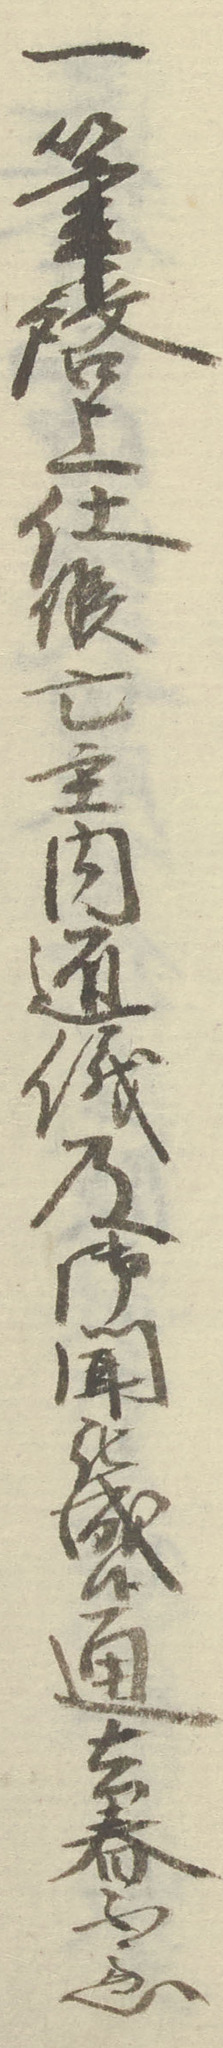一筆啓上仕候亡主内匠儀及御聞被成候通去春不慮

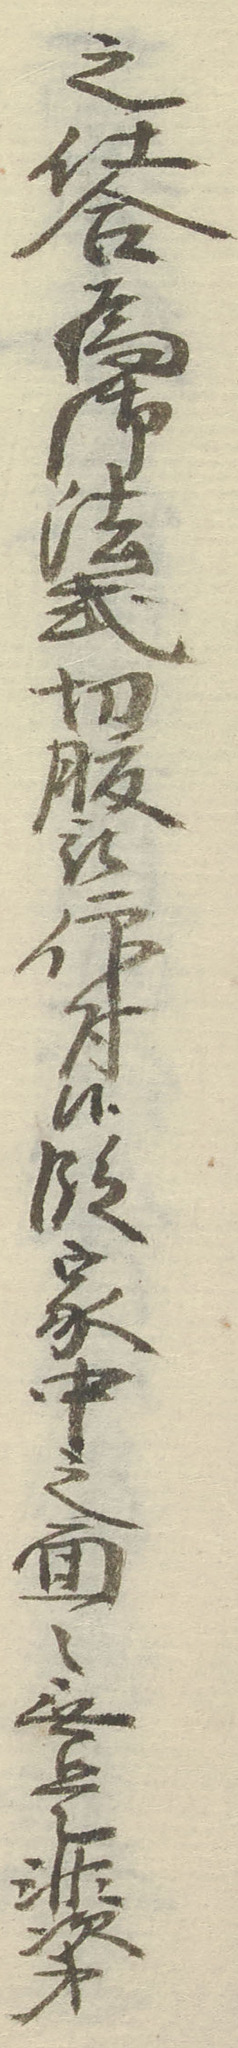之仕合為御法式切腹被仰付候段家中之面〻無是非次第
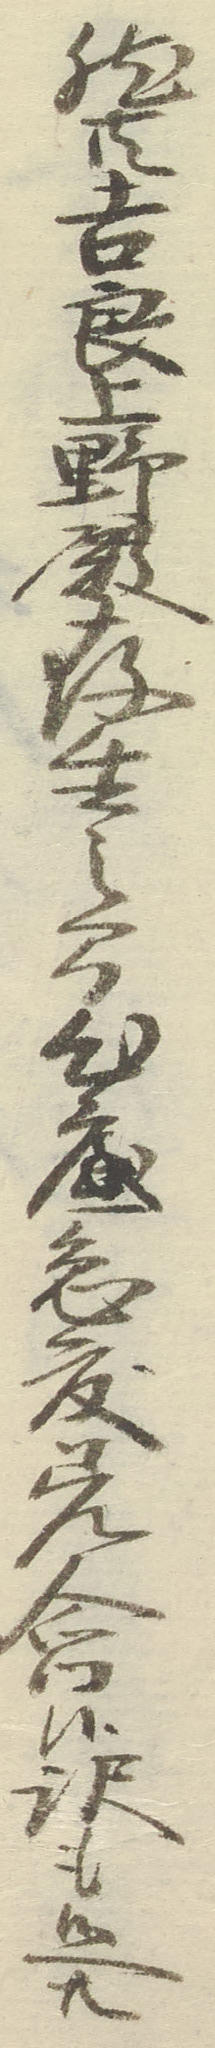然共吉良上野殿存生之間心底急度差含候訳も候へ共
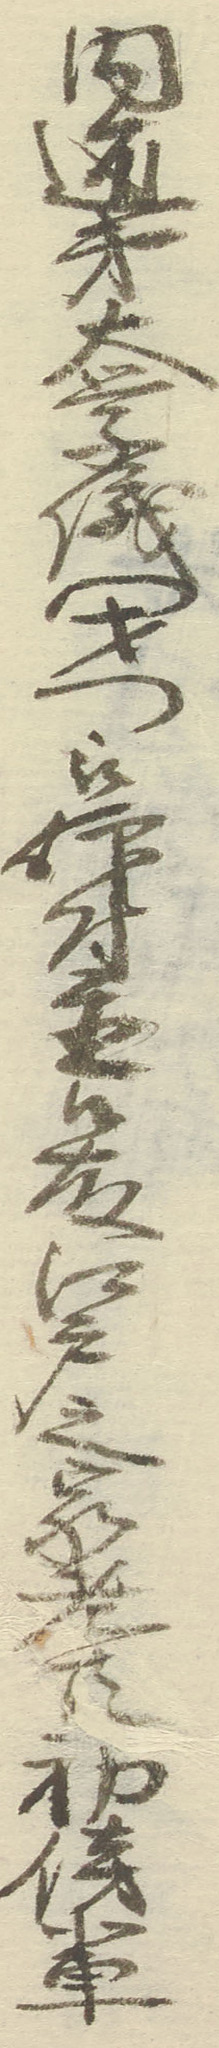内匠弟大学儀閉門被仰付置候故江戸之御家老共初傍輩
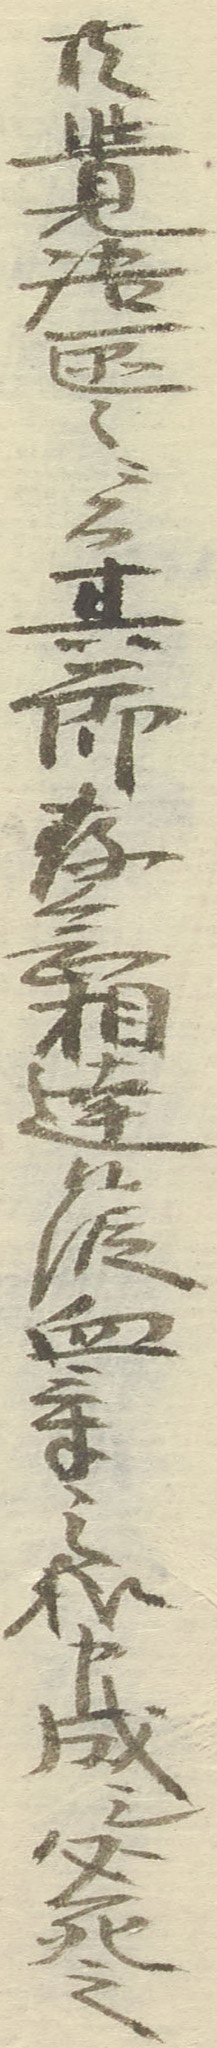共覚語區〻ニ而其節存念相達候段血気之様申成シ必死之
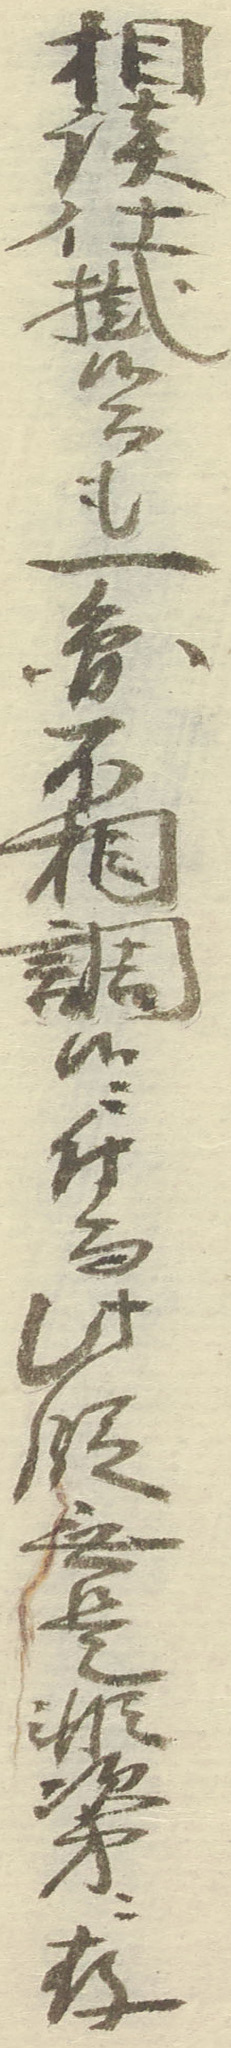相談仕掛候而も一圓不相調候ニ付而此段無是非次第ニ存
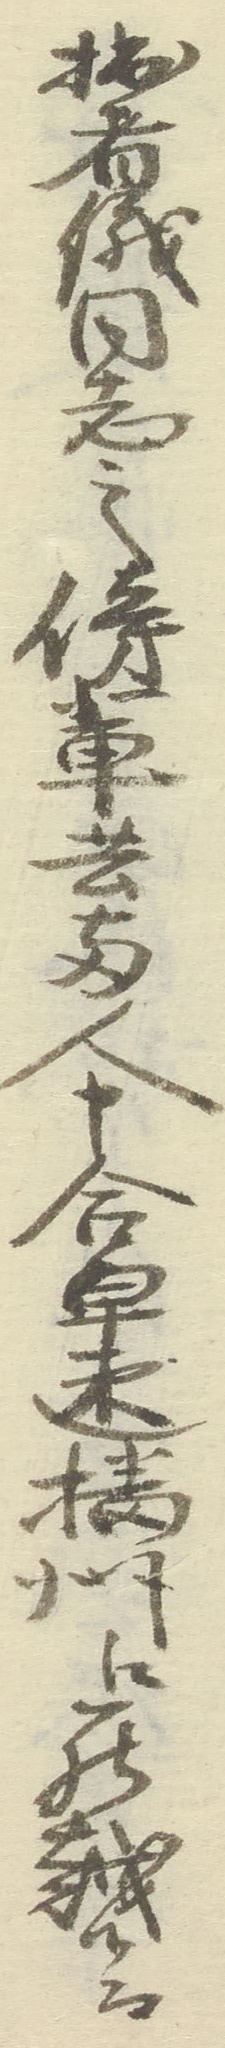拙者儀同志之傍輩共両人申合早速播州江罷越候而
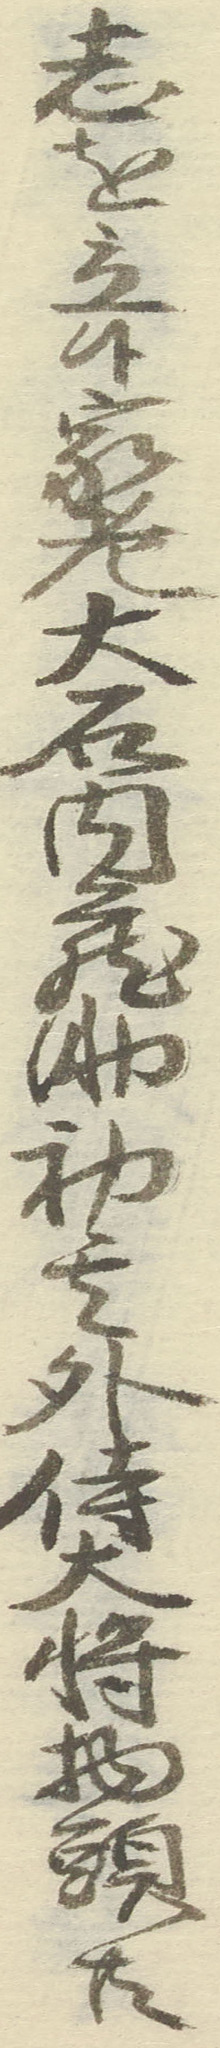志を立候家老大石内蔵助初其外侍大将物頭共
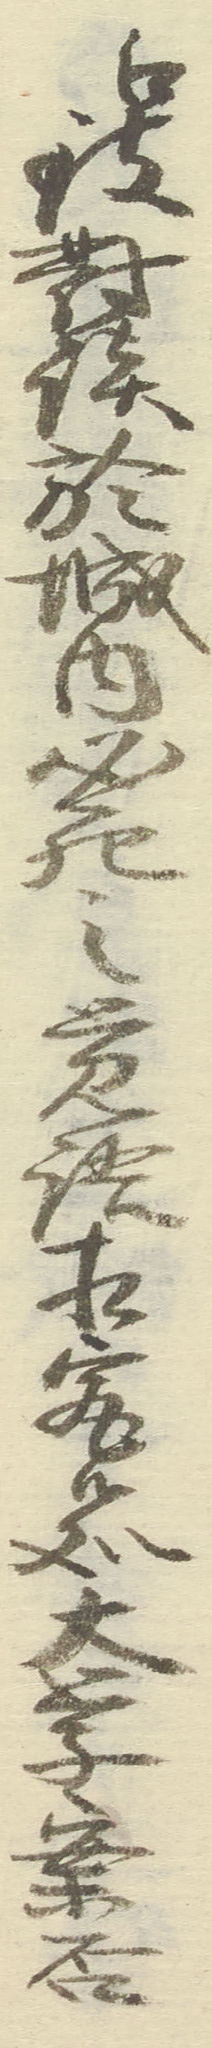江致對談於城内必死之覚語相究候処大学案否
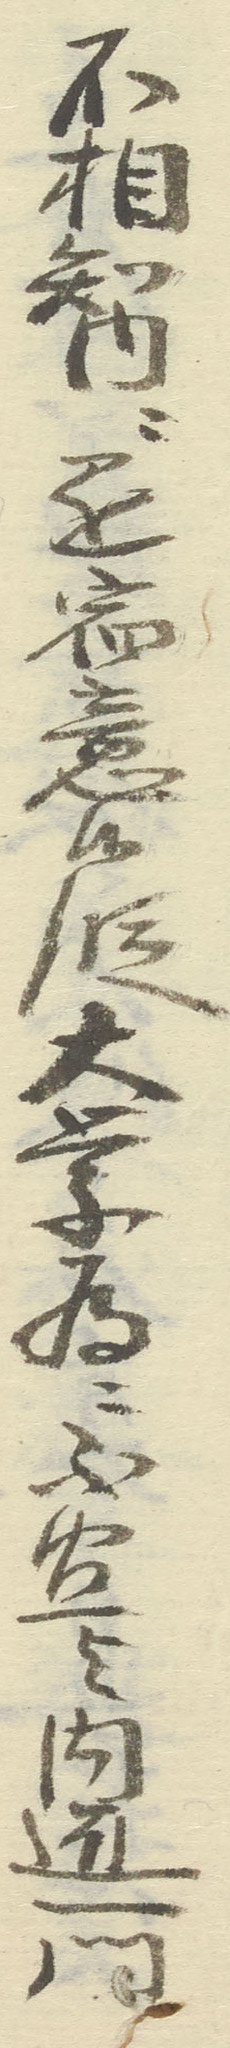不相知内ニ懸宿意候段大学為ニ不宜と内匠一門
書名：[七月二日京都大地震に付御番衆大木市左衛門より申し越し候書面畧書状写]
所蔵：東京大学総合図書館 General Library in the University of Tokyo, JAPAN
